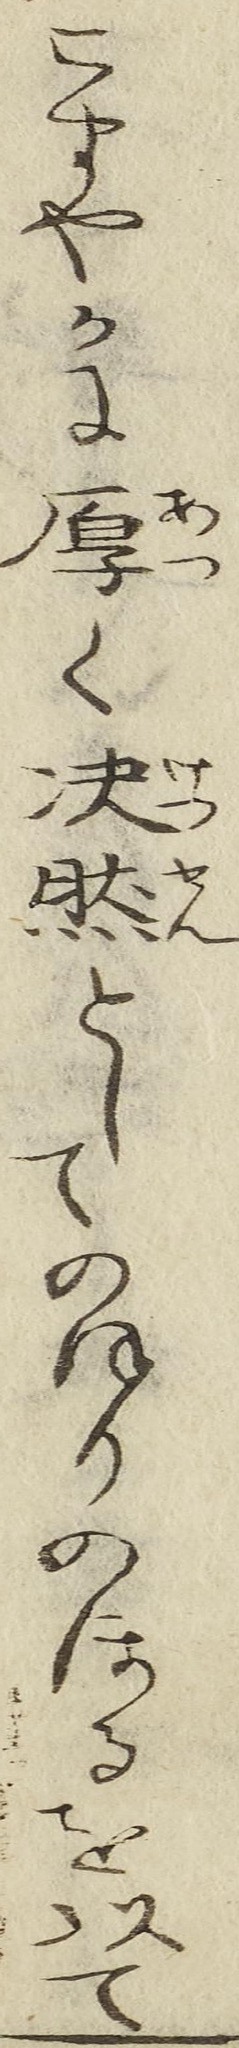こまやかに暑く決然としてのほりのほるを以て

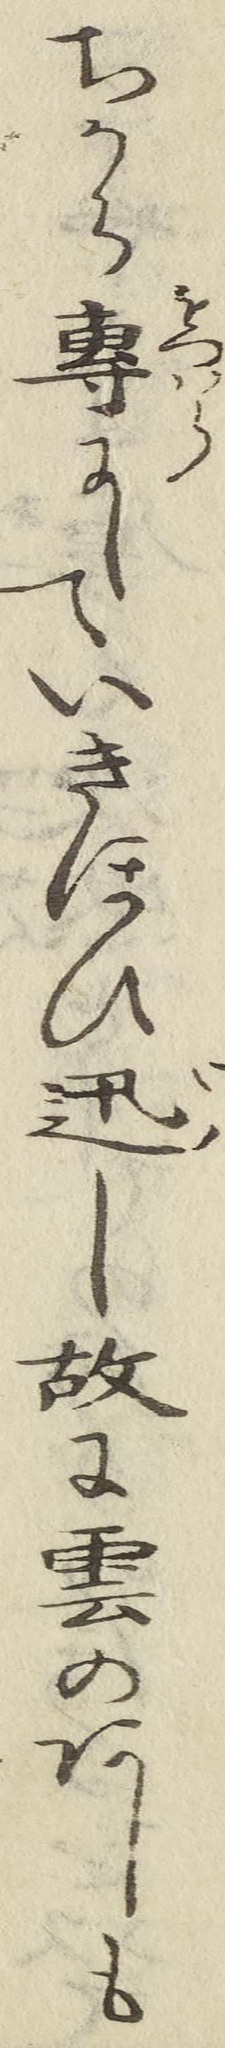ちから専にしていきほひ迅し故に雲のあしも
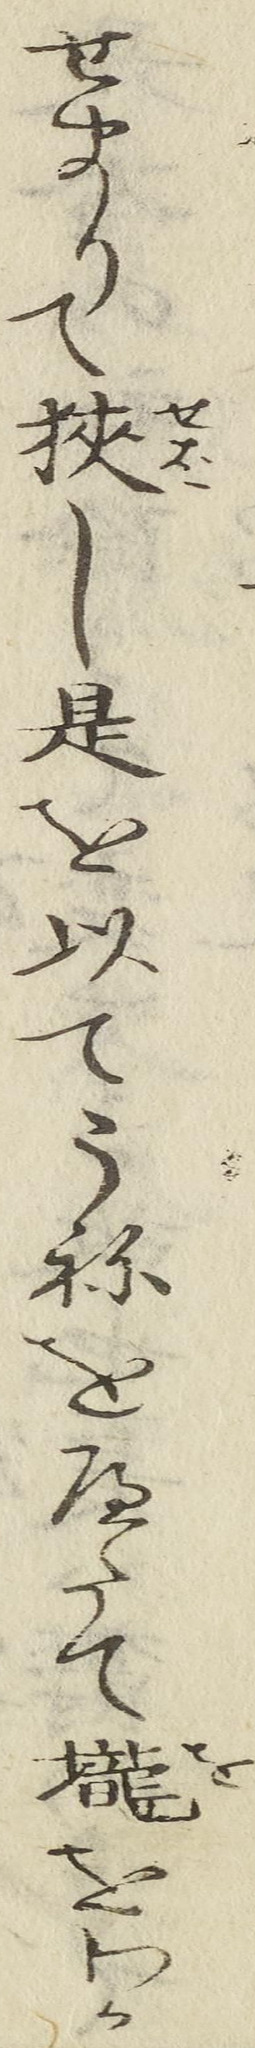せまりて狭し是を以てうねをへたて壠ををわか
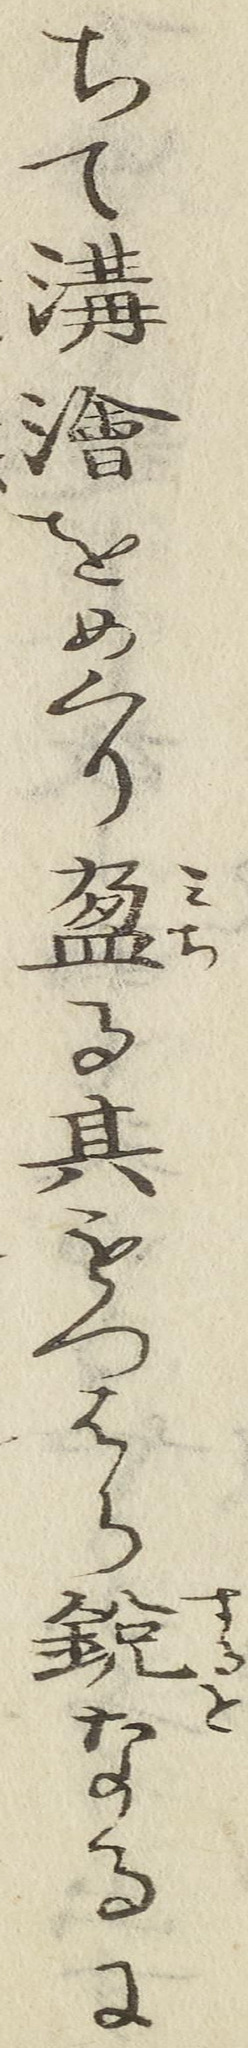ちて溝澮をめくり盈る其もつはら鋭なるに
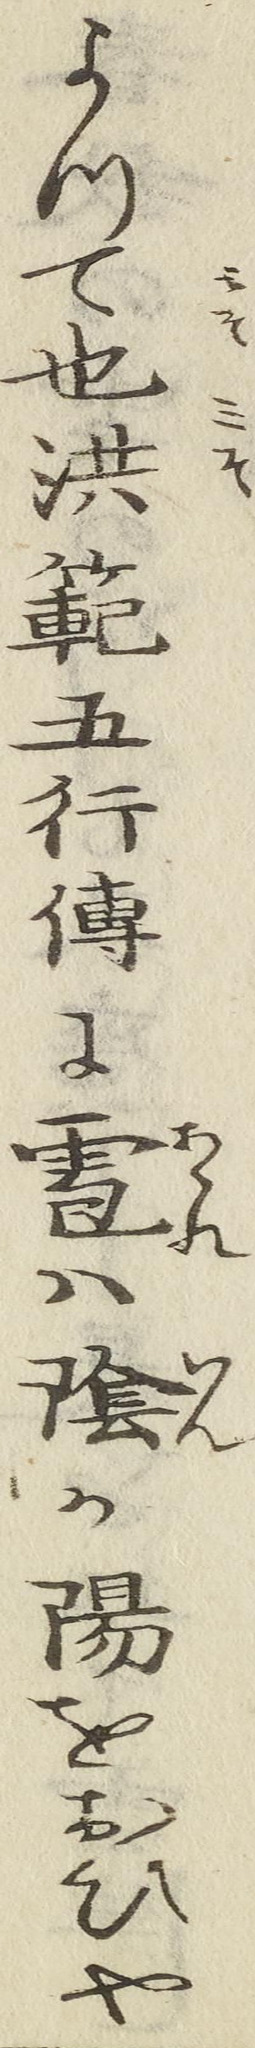よつて也洪範五行伝に雹は陰か陽をおひや
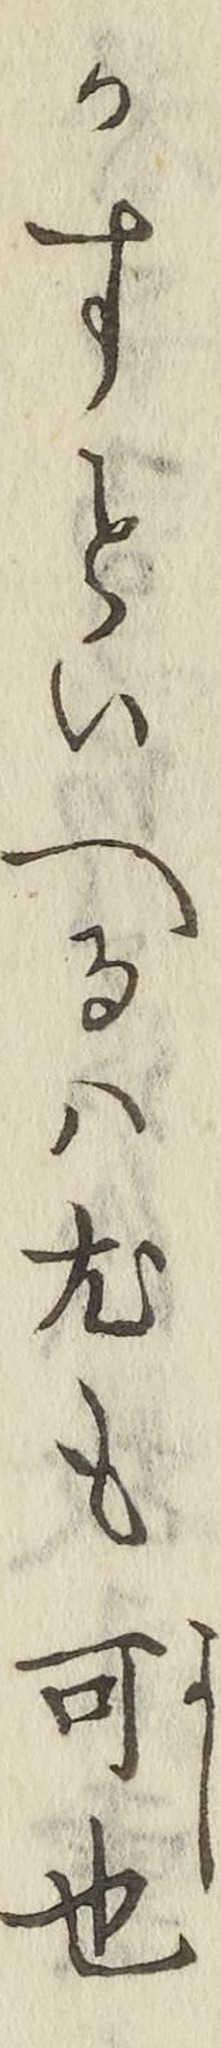かすといへるは尤も可也
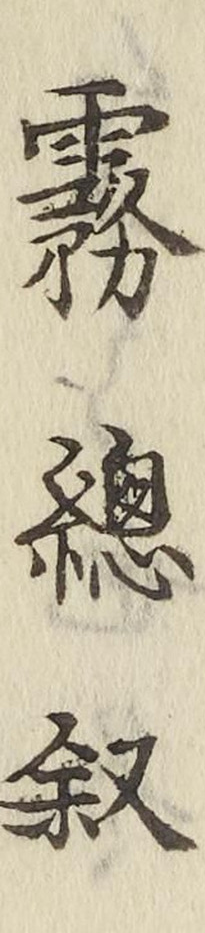霧総叙
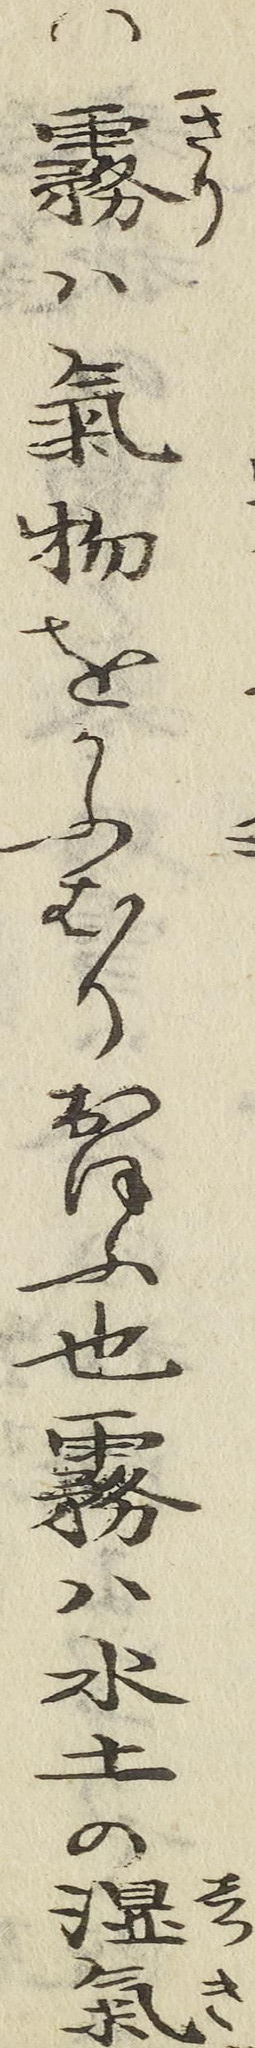○霧は気物をかふむりおほふ也霧は水土の湿気
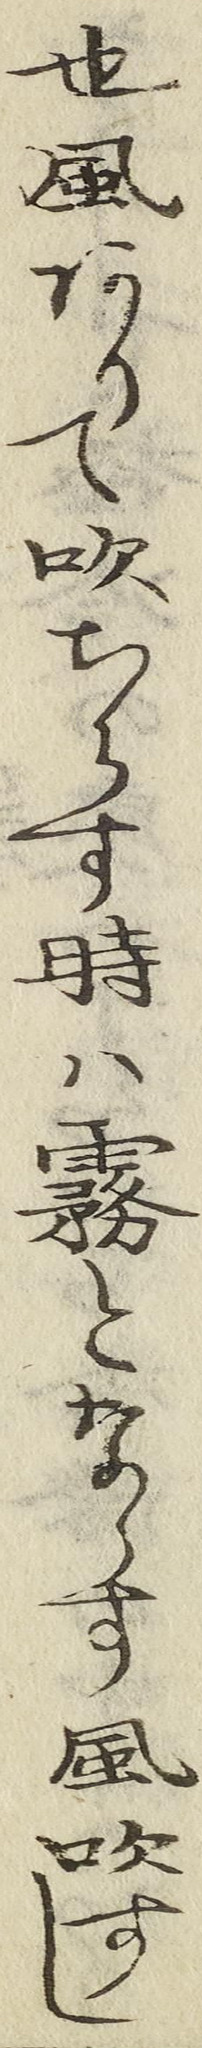也風ありて吹ちらす時は霧とならす風吹すし
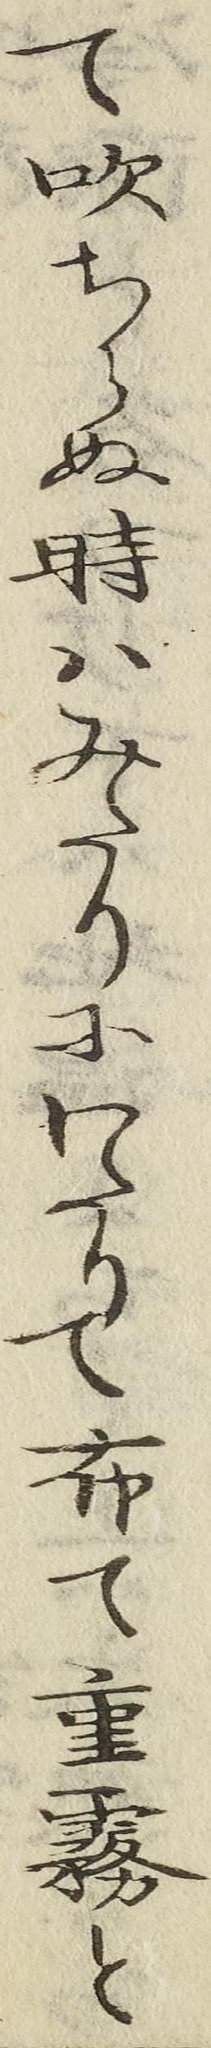て吹ちらぬ時はみたりにわたりて布て重霧と
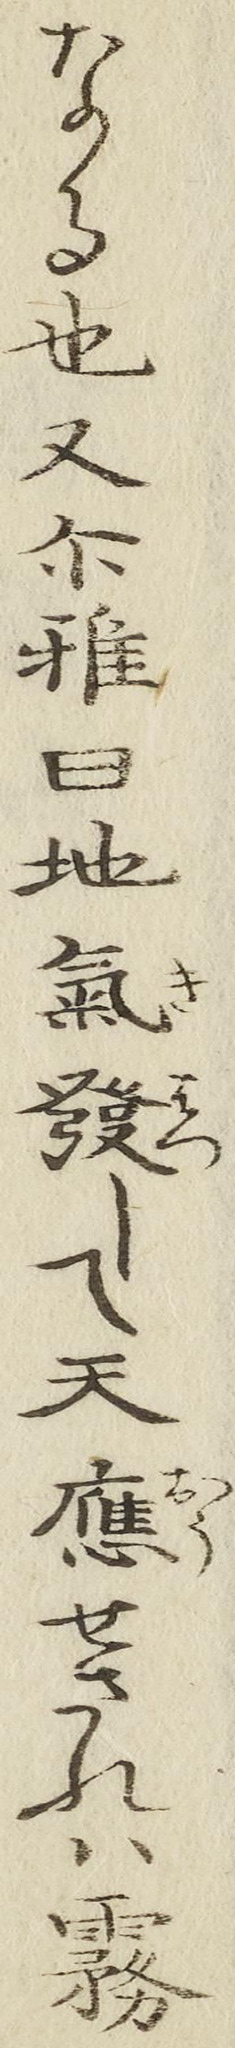なる也又尓雅曰気発して天応せされは霧
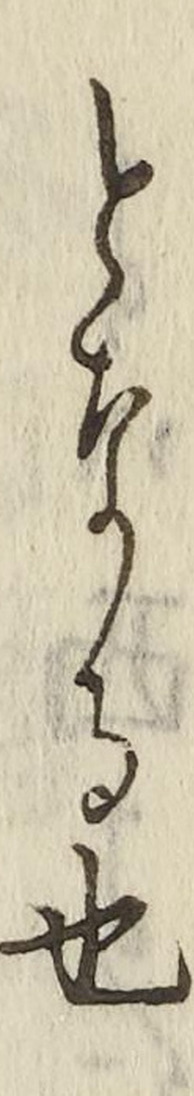となる也
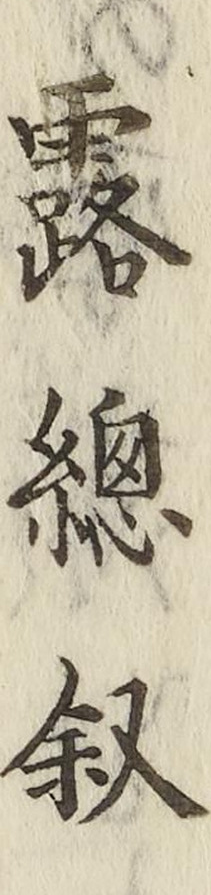露総叙
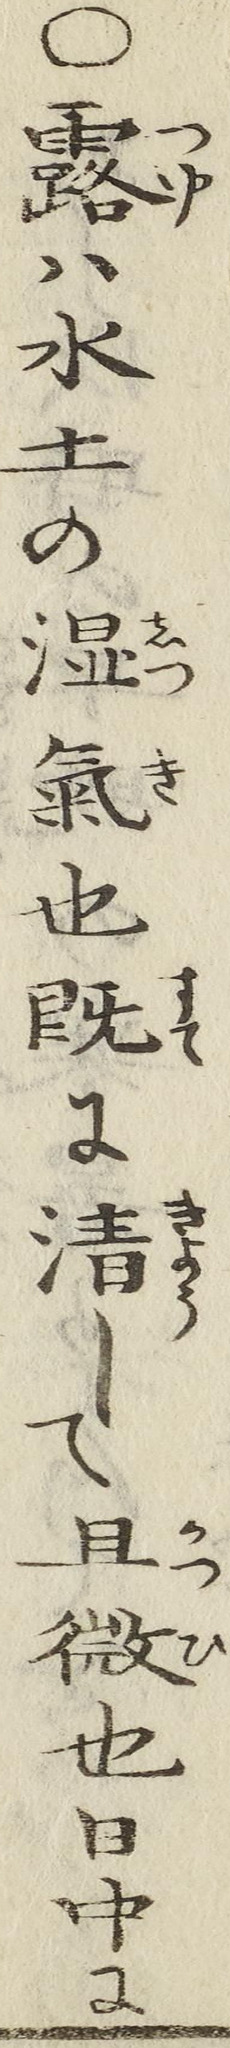○露は水土の湿気也既に清して且微也日中に
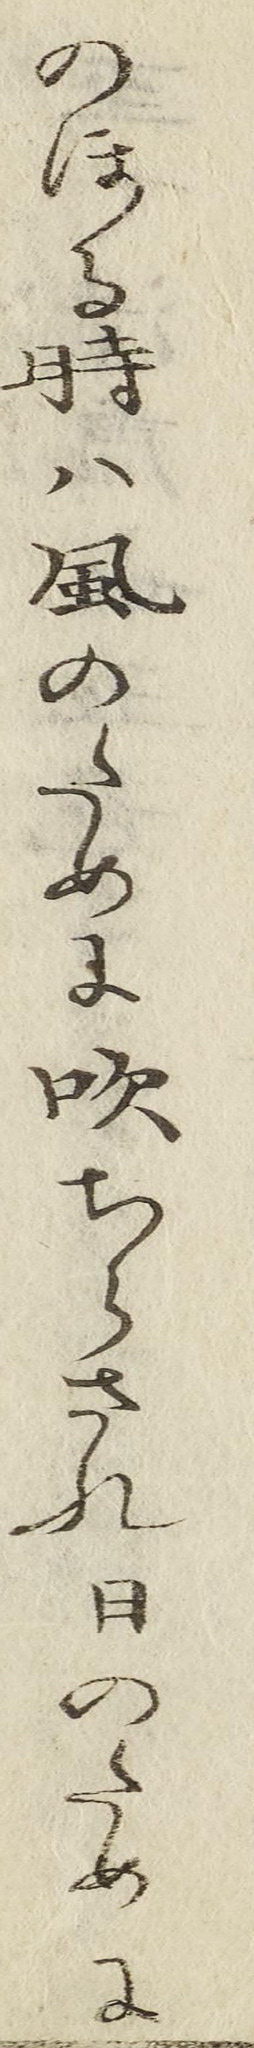のほる時は風のために吹ちらされ日のために
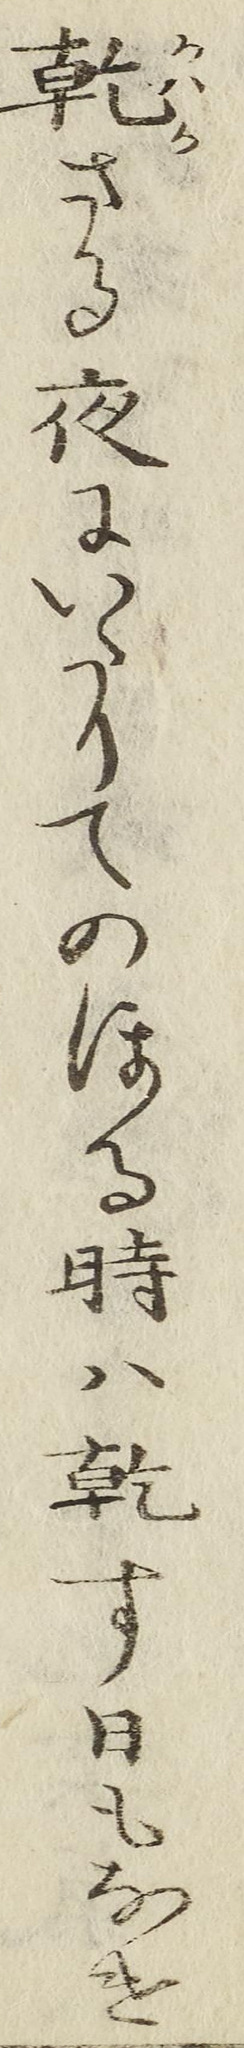乾さる夜にいたりてのほる時は乾す日もなけ
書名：天時占候　二
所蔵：東京大学地震研究所図書室 Earthquake Research Institute Library, The University of Tokyo, JAPAN
